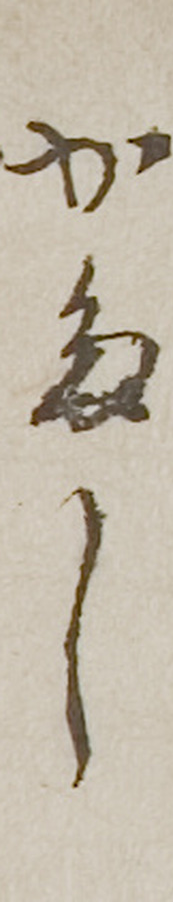かたし
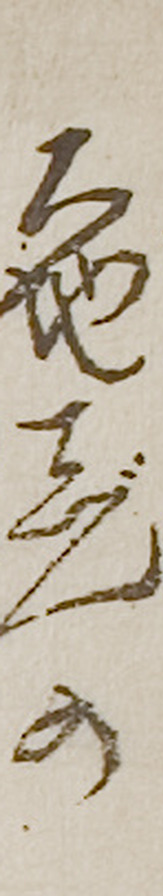大地しんの
